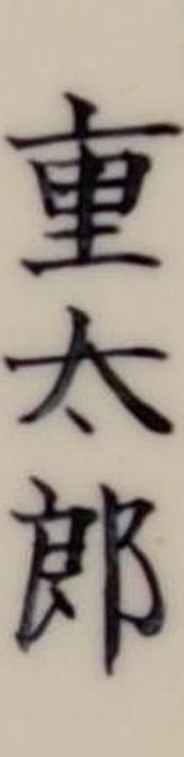重太郎
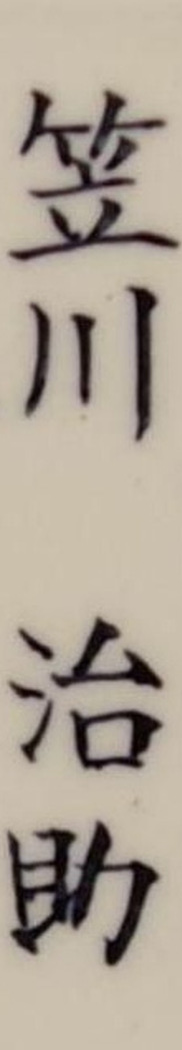笠川治助
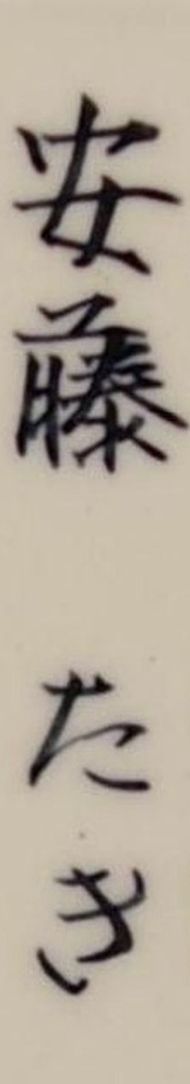安藤たき
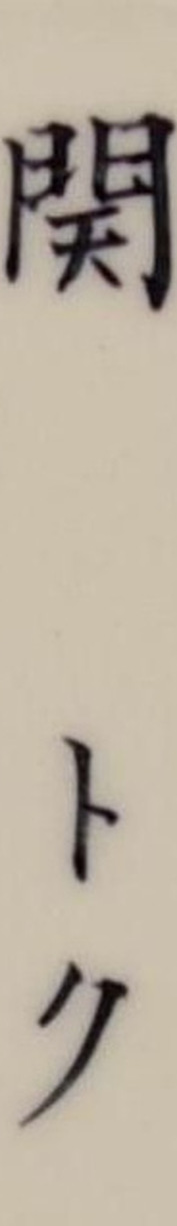関トク
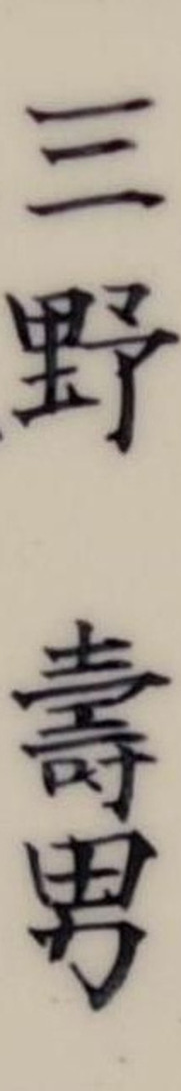三野壽男
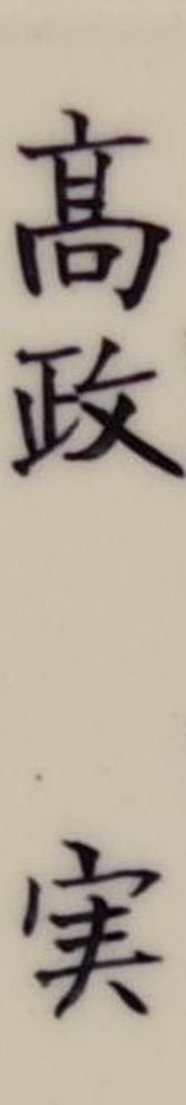高政実
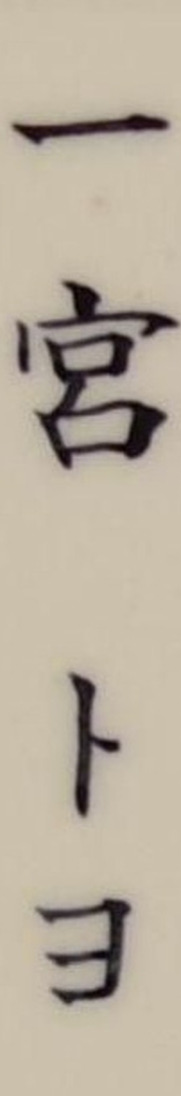一宮トヨ
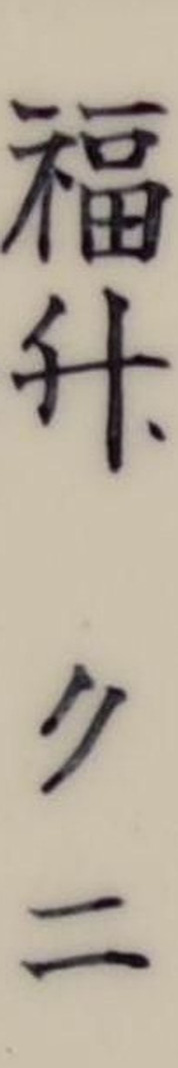福升ク二
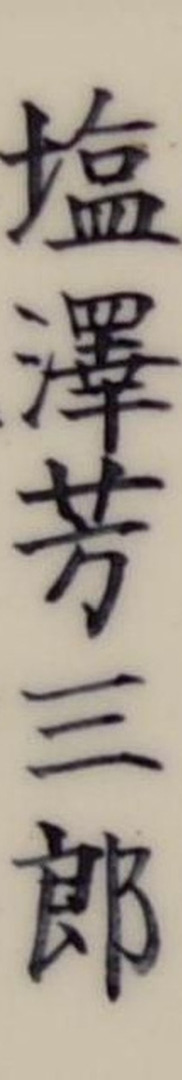塩澤芳三郎
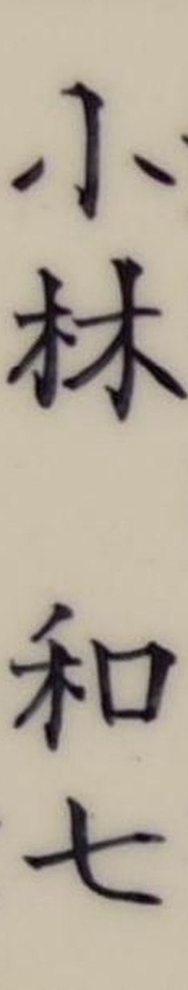小林和七
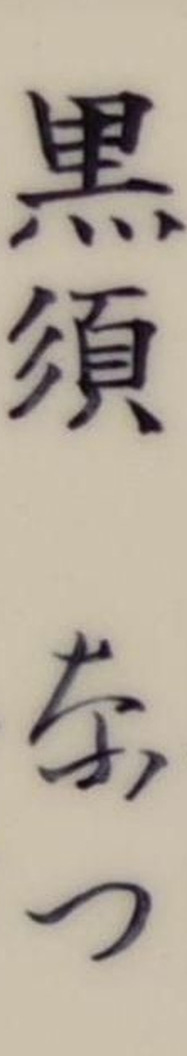黒須なつ
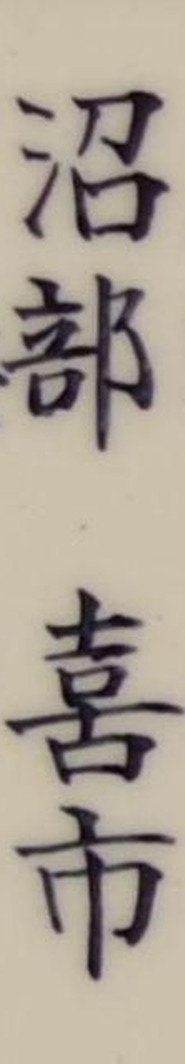沼部喜市
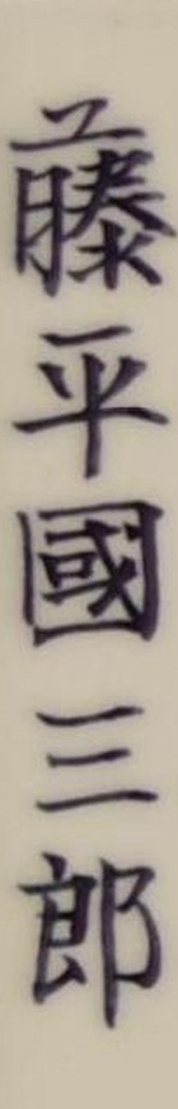藤平國三郎

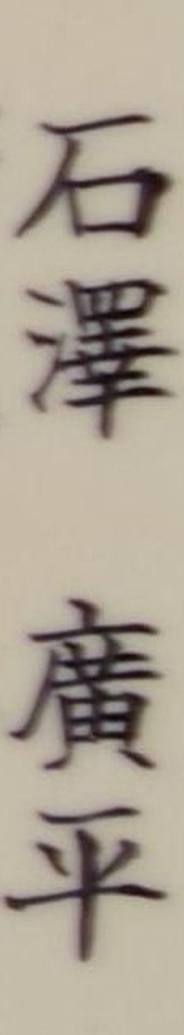石澤廣平
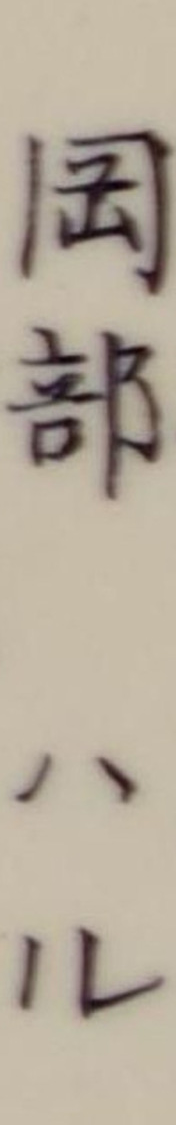岡部ハル
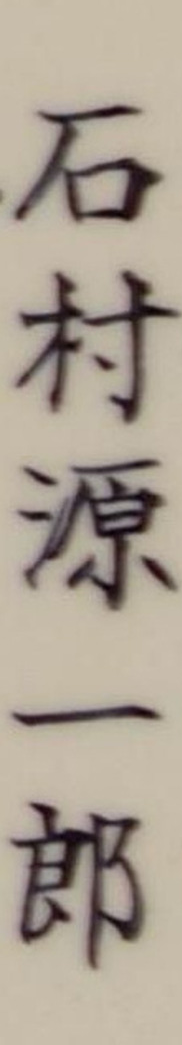石村源一郎
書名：M~S
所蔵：高野山金剛峯寺
